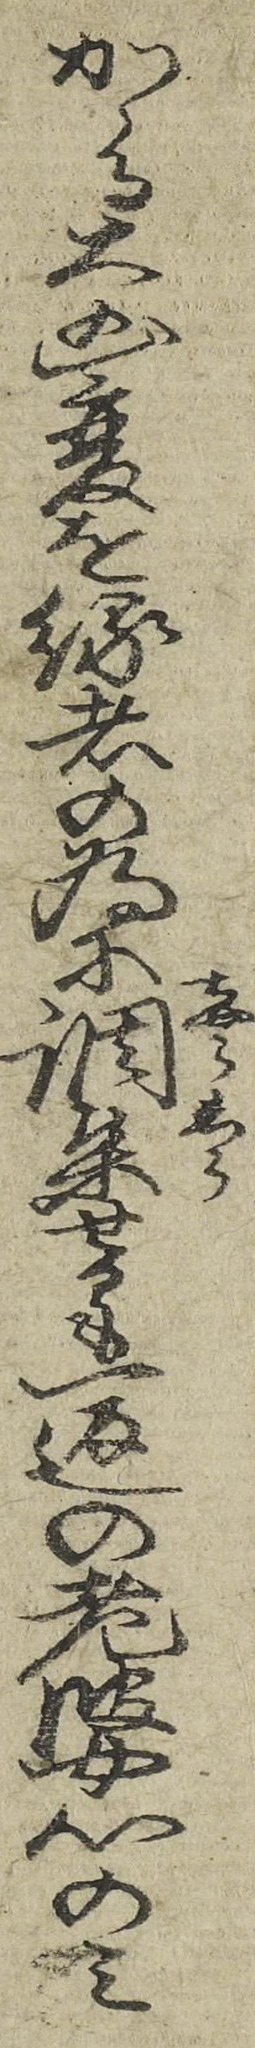かゝる大凶変を縁者の為に調集せるも一返の老婆心のみ
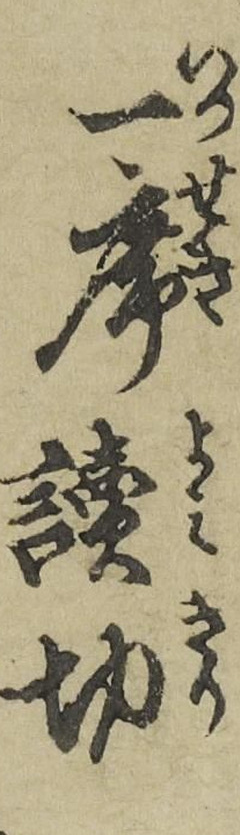一席読切
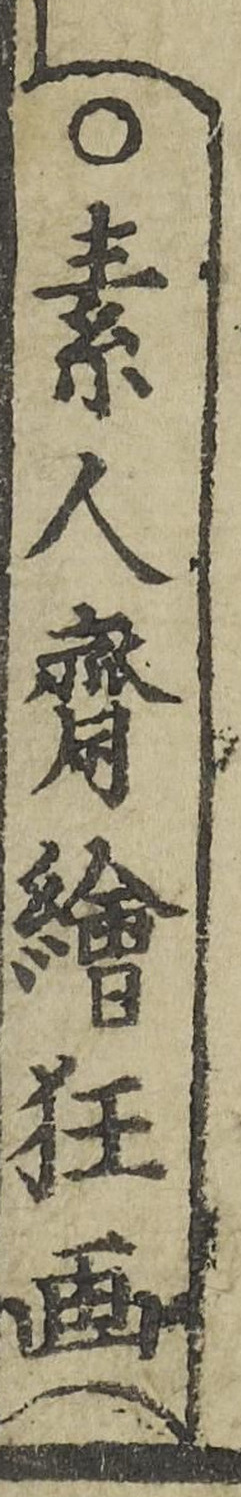◯素人斉絵狂画

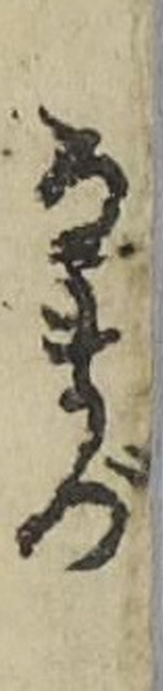なまづ
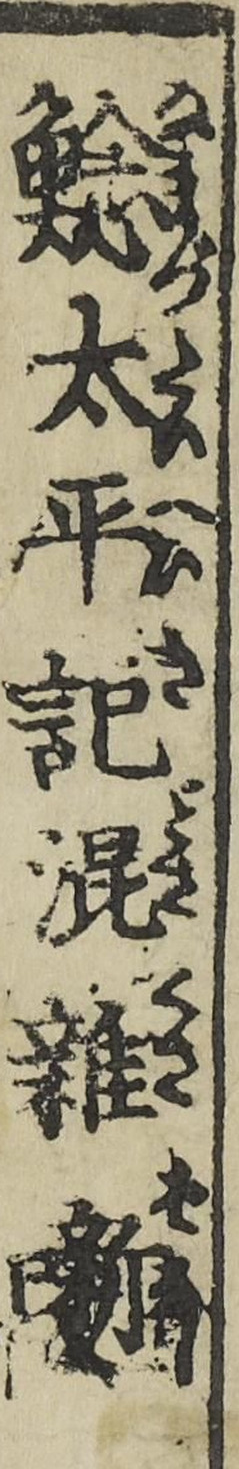鯰太平記混雑噺
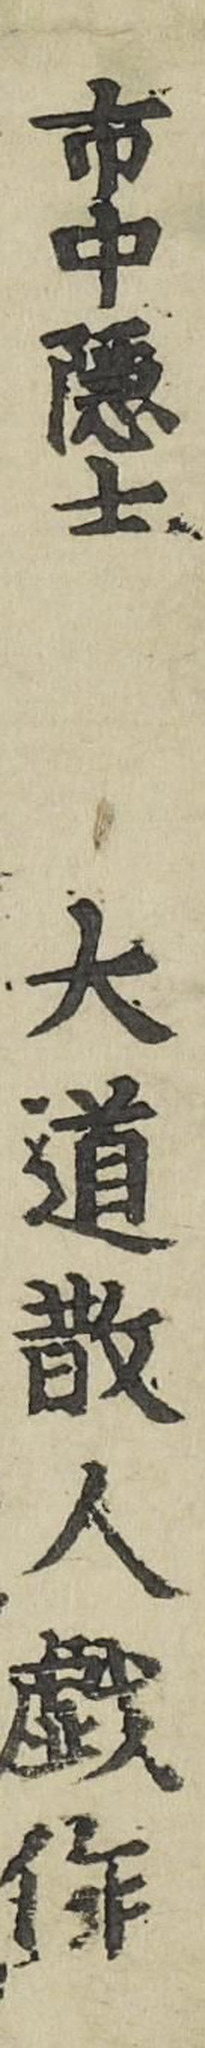市中隠士大道散人戯作
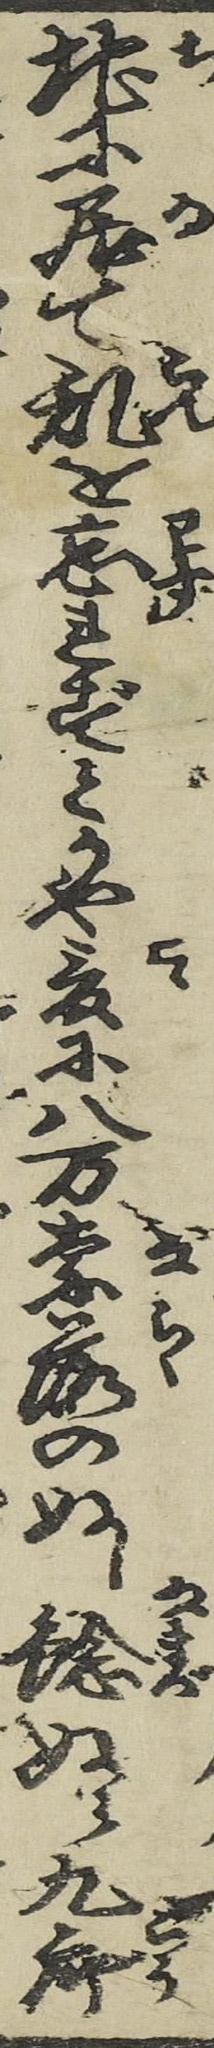地に居て乱を忘れずとかや爰に八万奈落のぬし鯰ぬら九郎
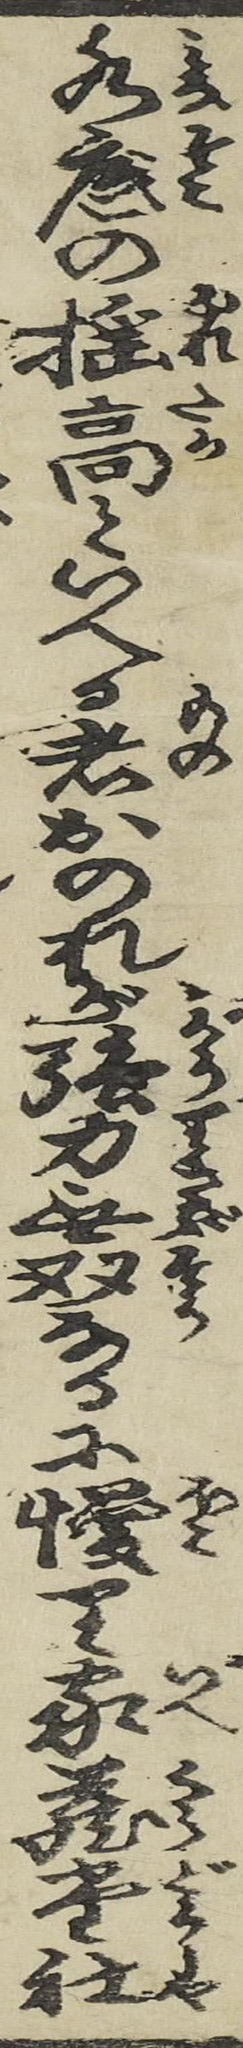水底の揺高といへる者おのれが強力無双なるに慢り家蔵堂社
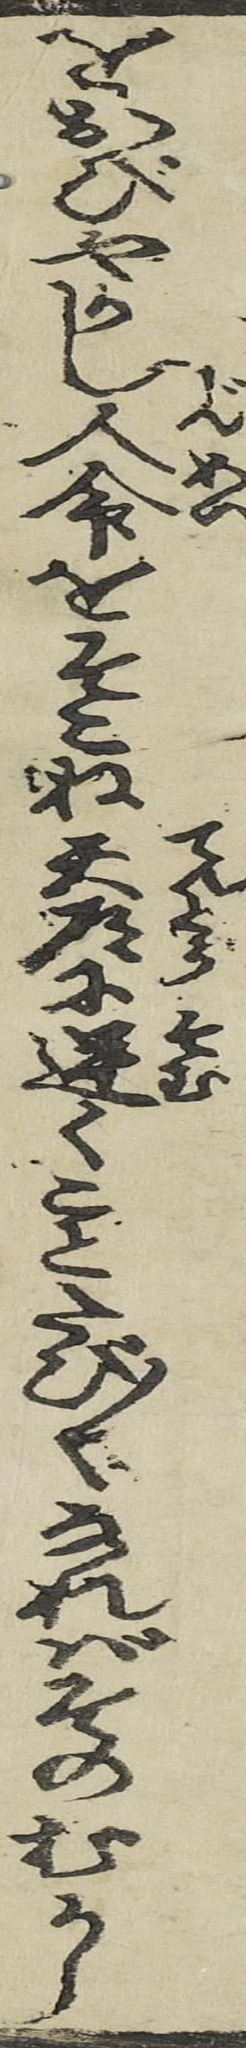をおびやかし人命をそこね天道に逆くことたび〴〵なればそのむかし
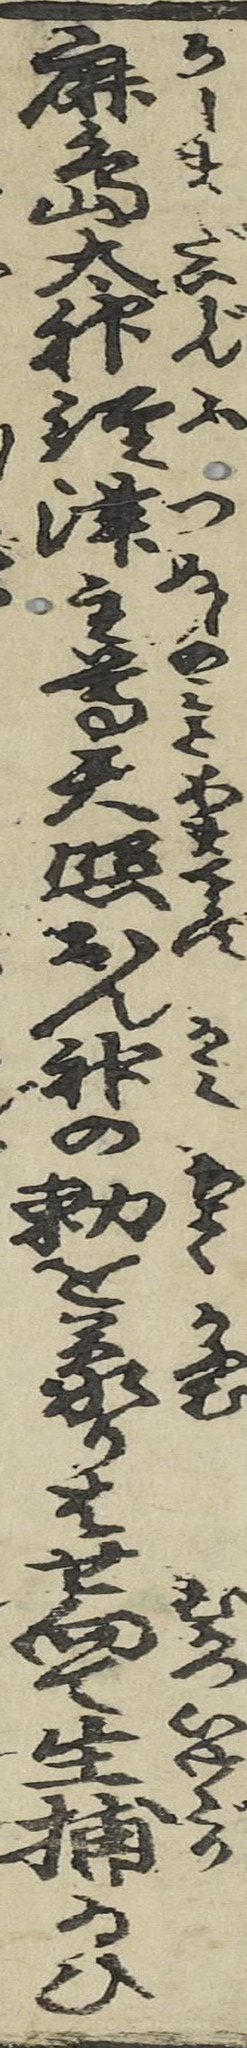廉島太神経津主尊天照おん神の勅を蒙りはせ向て生捕給ひ
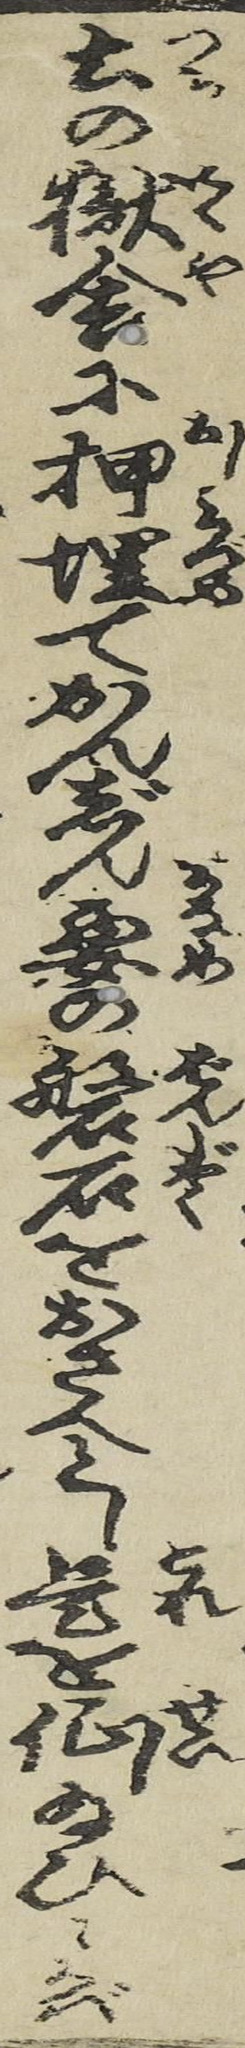土の獄舎に押埋てかんぢん要の盤石をおさへとし是を仰給ひしかば
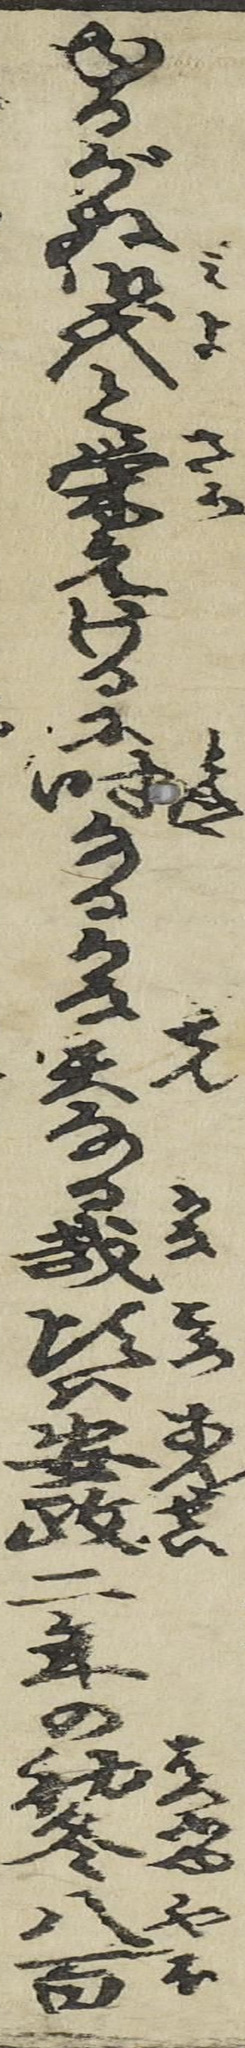ゆるがぬ御代と栄えけるに時なるかな天なる哉頃は安政二年の初冬八百
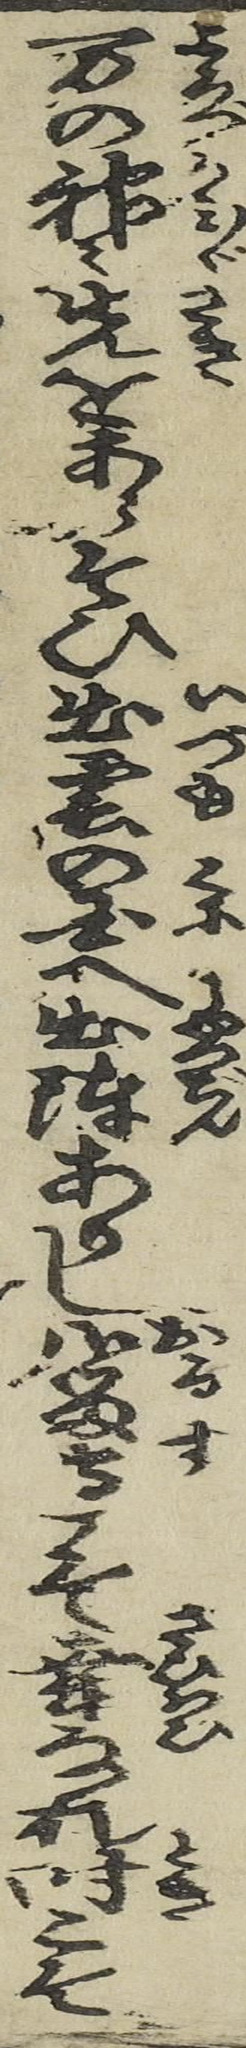万の神々先をあらそひ出雲の国へ出陣ありし御留守こそ幸なれ時こそ
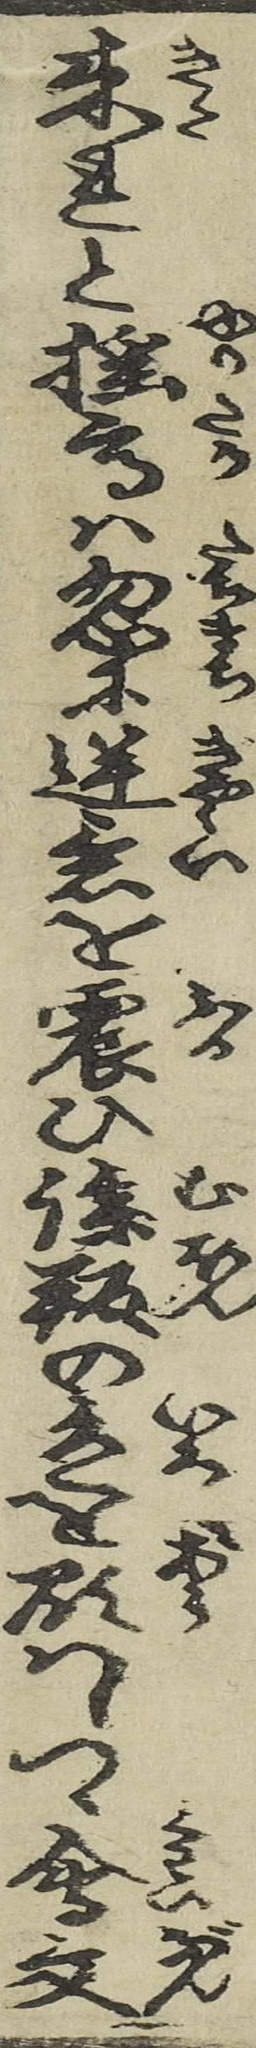来れと揺高は忽に逆意を震ひ謀叛の色を顕はしつゝ会文
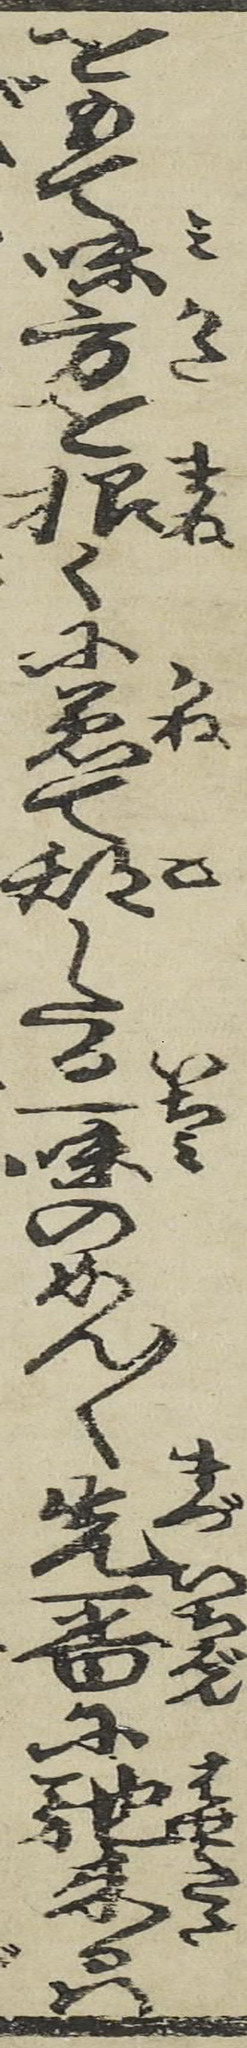をもて味方を招くに兼て故したる一味のめん〳〵先一番に馳来るは
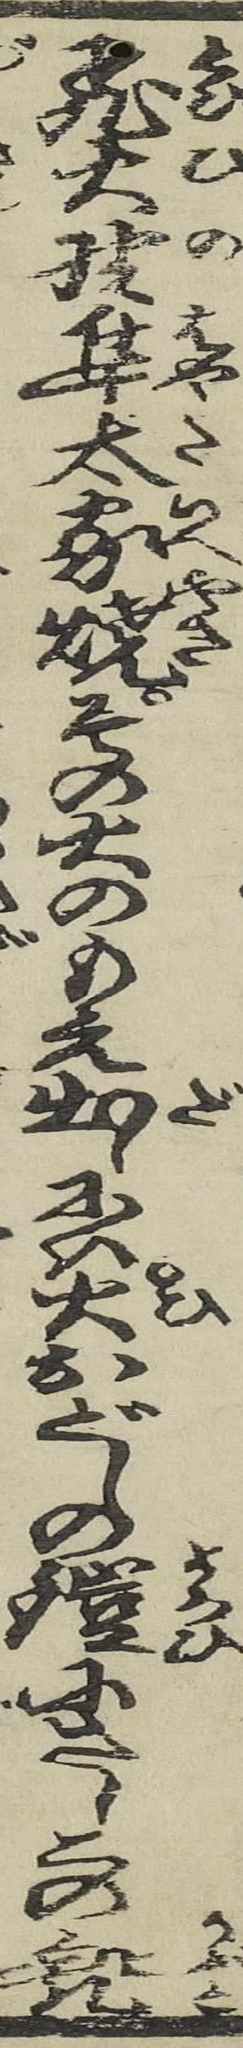飛火野隼大家焼その火のもえ出しには火おどしの鎧にさしこの兜
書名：安政大地震畧記　全
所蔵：東京大学地震研究所図書室 Earthquake Research Institute Library, The University of Tokyo, JAPAN
